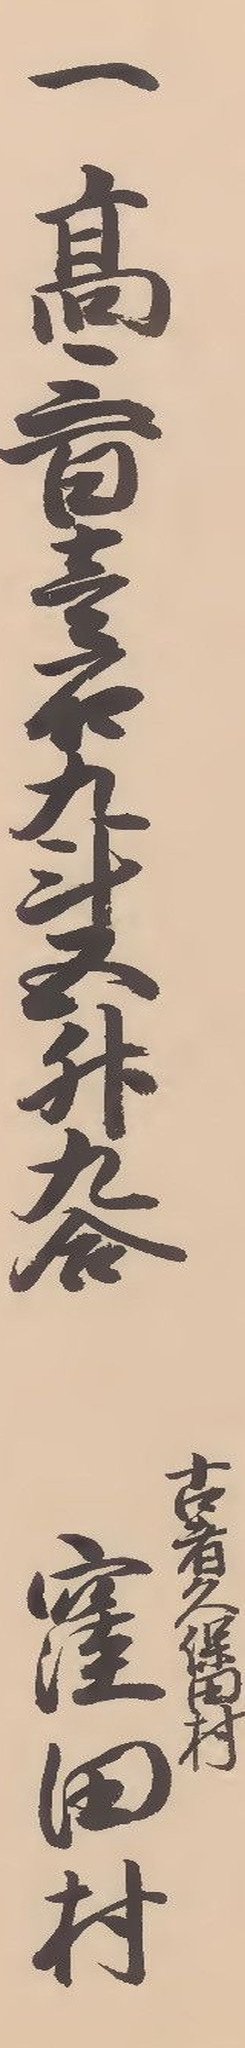一高三百壱石九斗五升九合窪田村
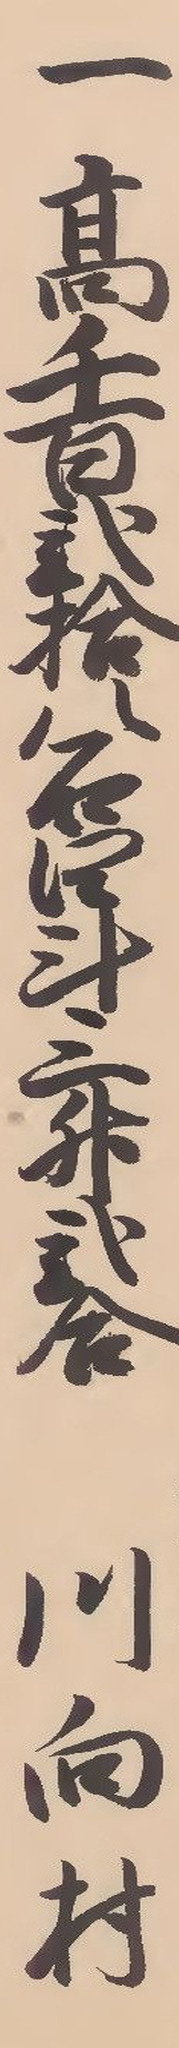一高千百弐拾八石四斗三升弐合川向村
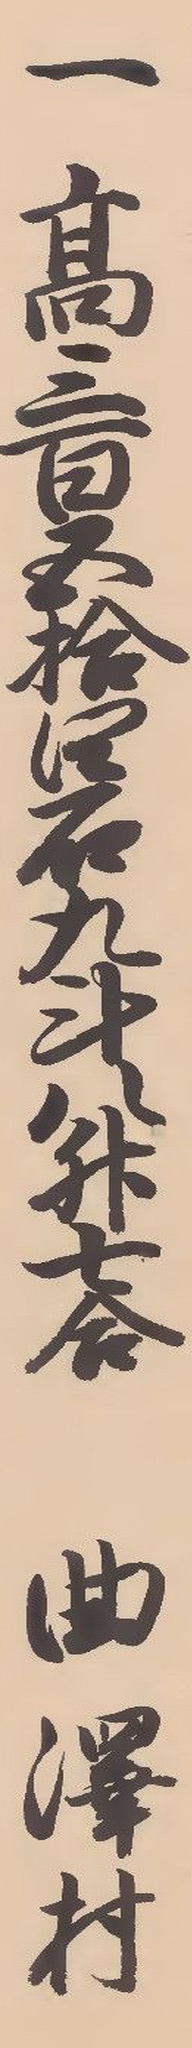一高三百五拾四石九斗八升七合曲沢村
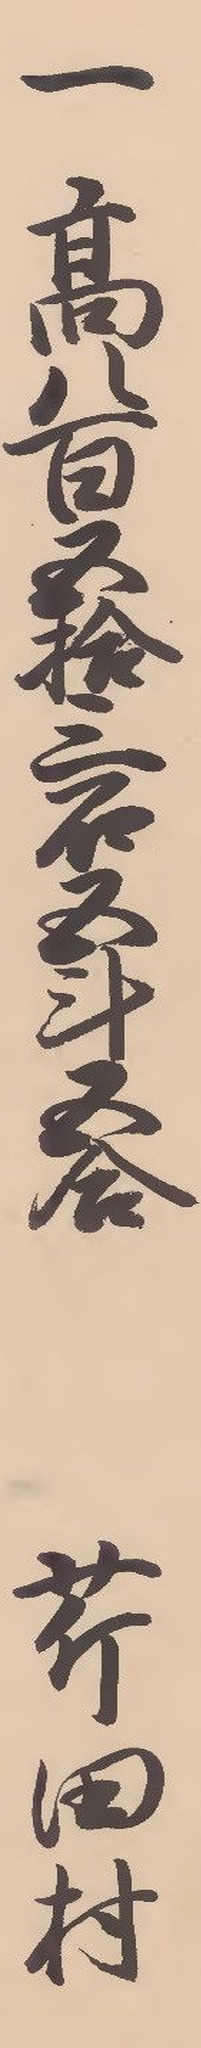一高八百五拾三石五斗五合芹田村
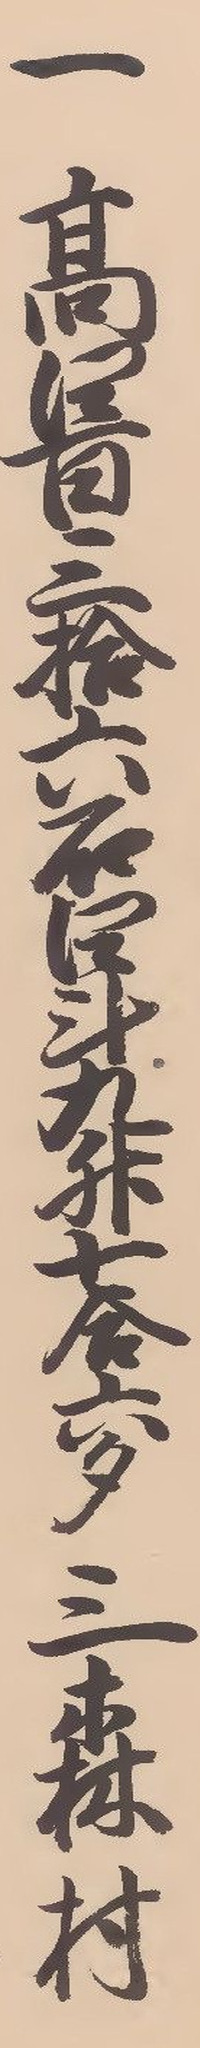一高四百三拾六石四斗九升七合六勺三森村
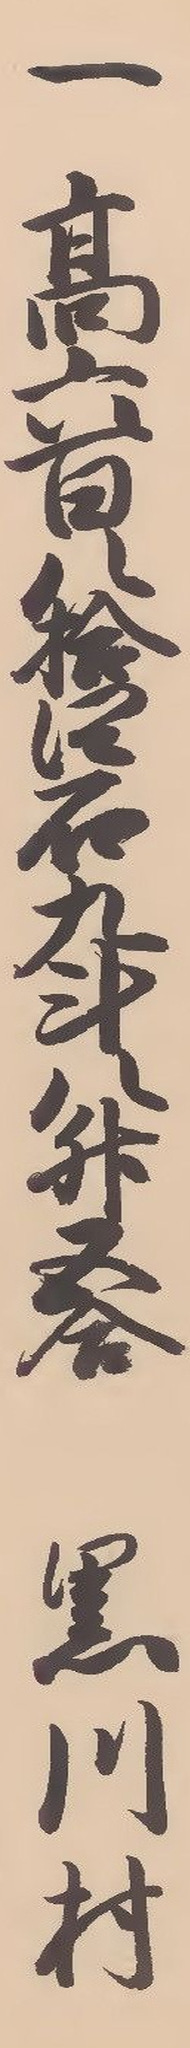一高六百八拾四石九斗八升五合黒川村

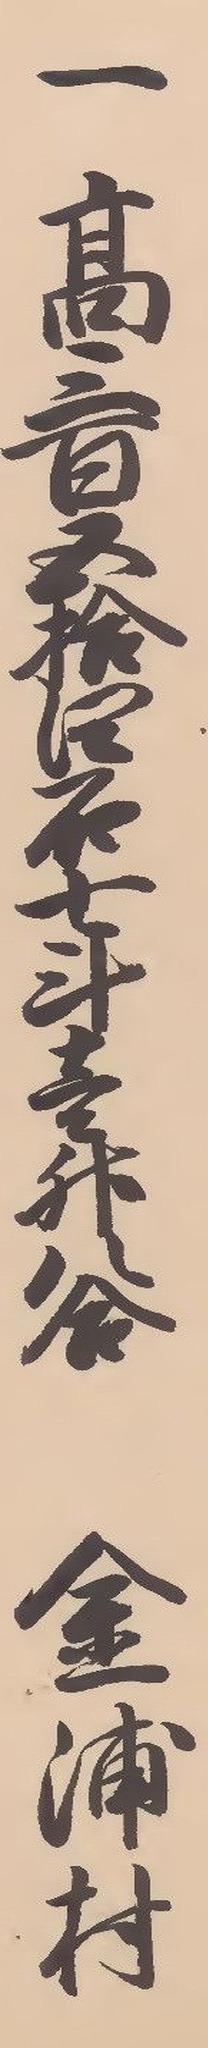一高三百五拾四石七斗壱升八合金浦村
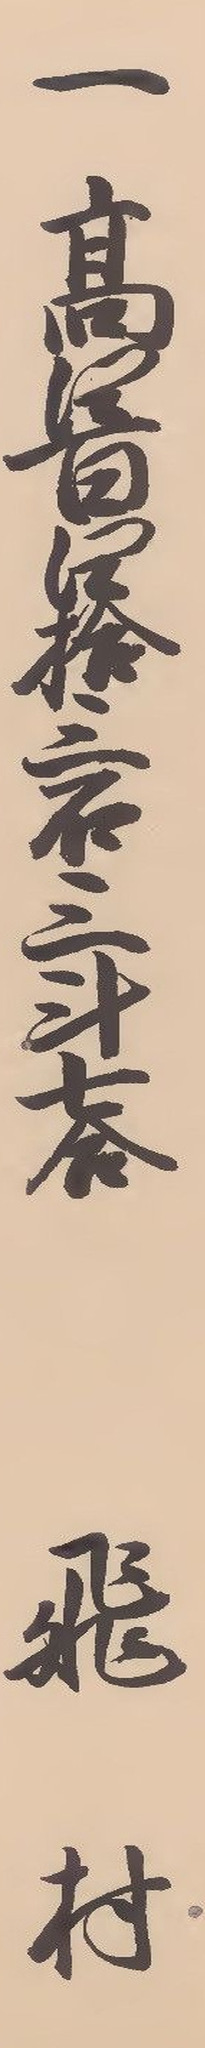一高四百四拾三石三斗七合飛村
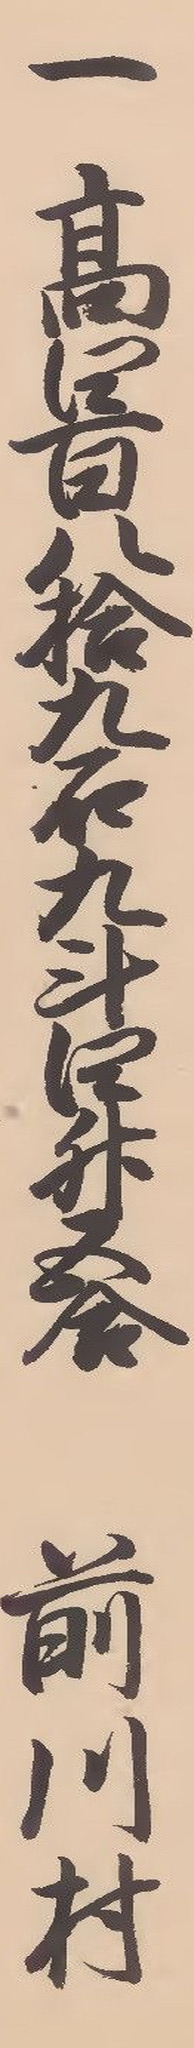一高四百八拾九石九斗四升五合前川村
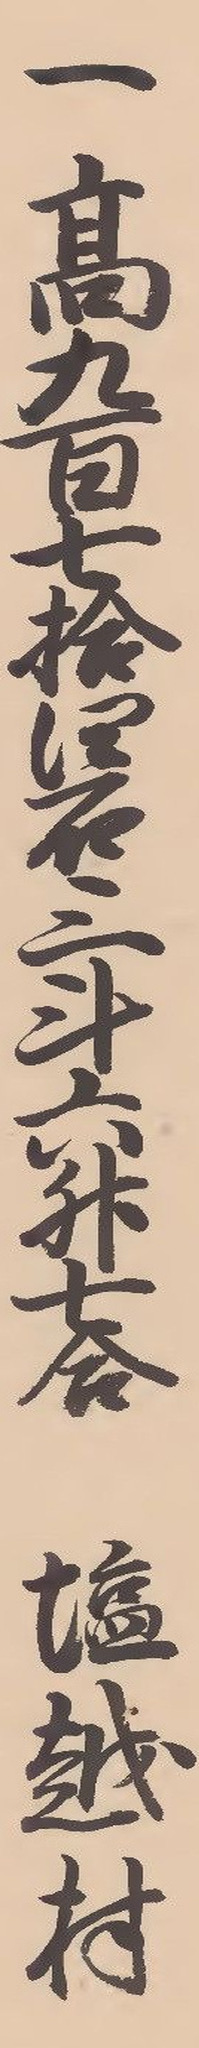一高九百七拾四石三斗六升七合塩越村
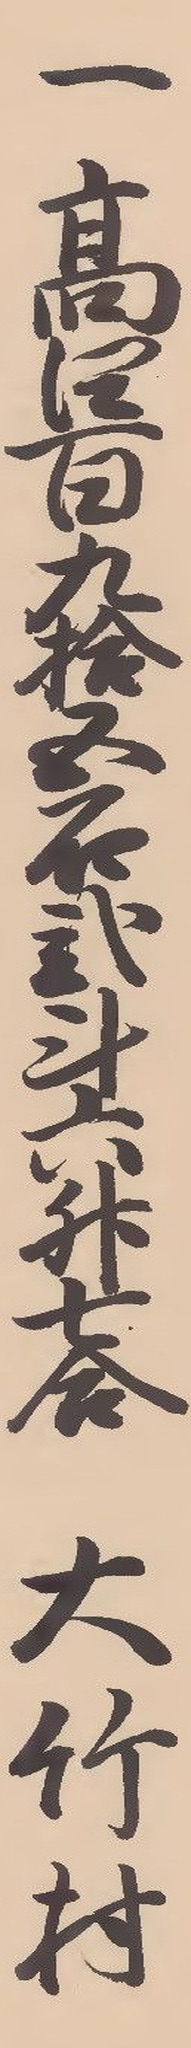一高四百九拾五石弐斗六升七合大竹村
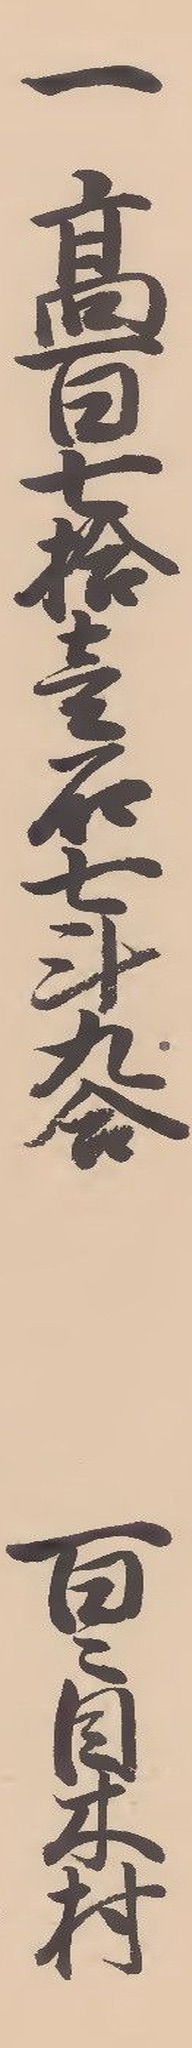一高百七拾壱石七斗九合百々目木村
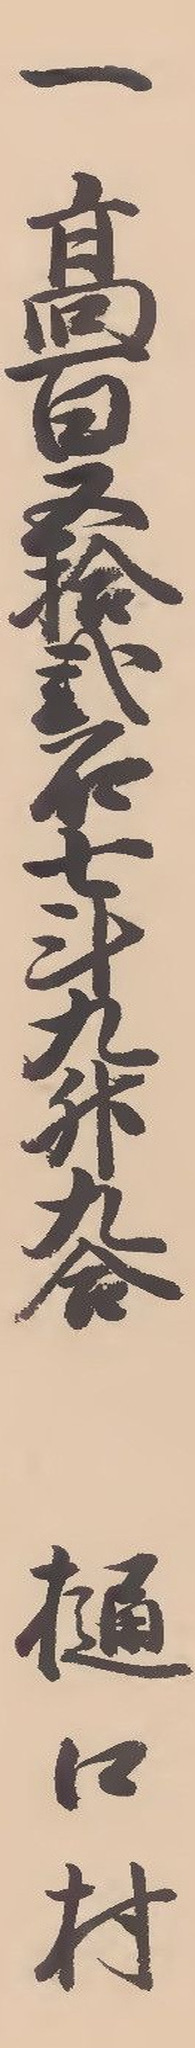一高百五拾弐石七斗九升九合樋口村

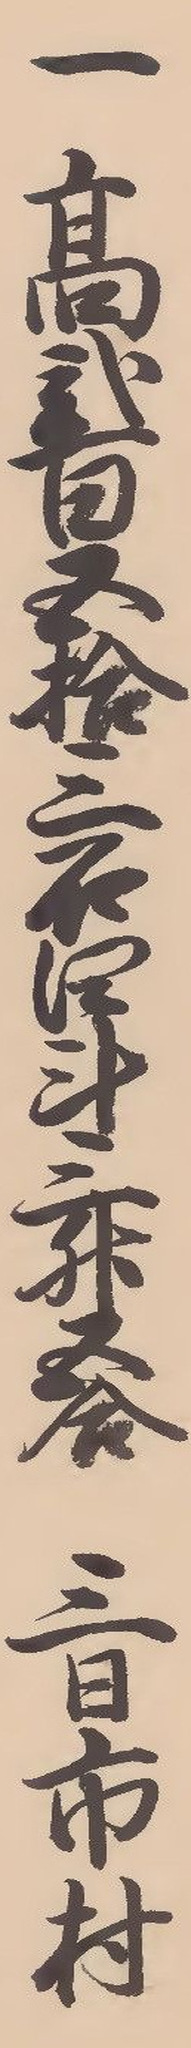一高弐百五拾三石四斗三升五合三日市村
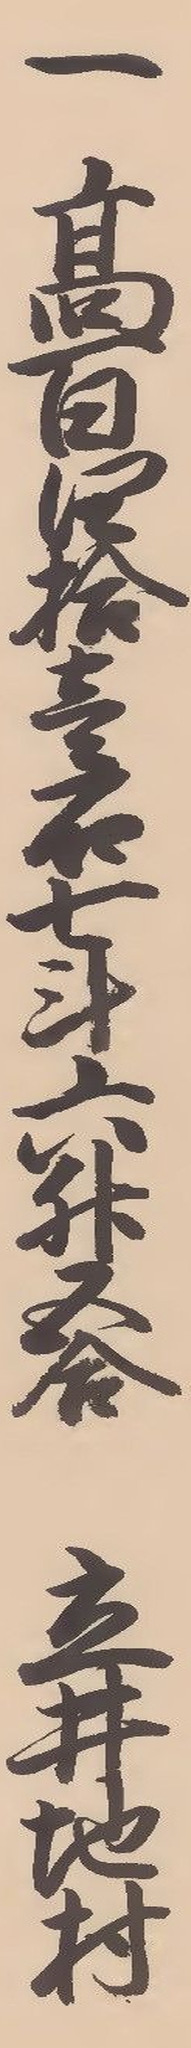一高百四拾壱石七斗六升五合立井地村
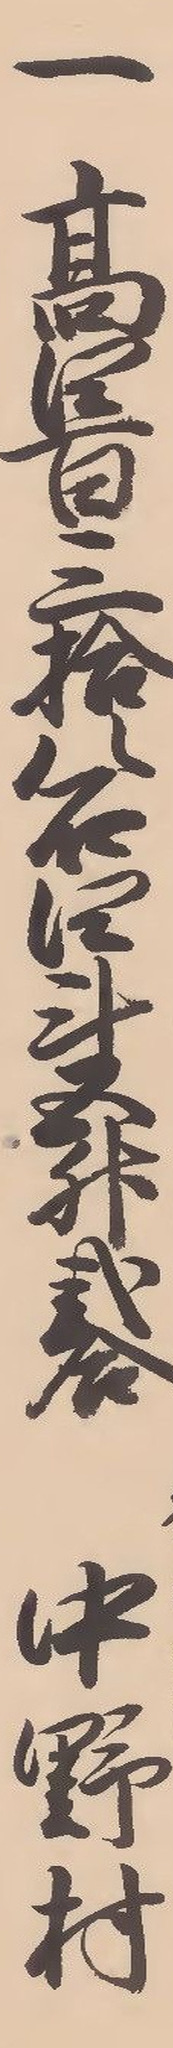一高四百三拾八石四斗五升弐合中野村
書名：出羽国郷帳　５
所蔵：国立公文書館 National Archives of Japan
